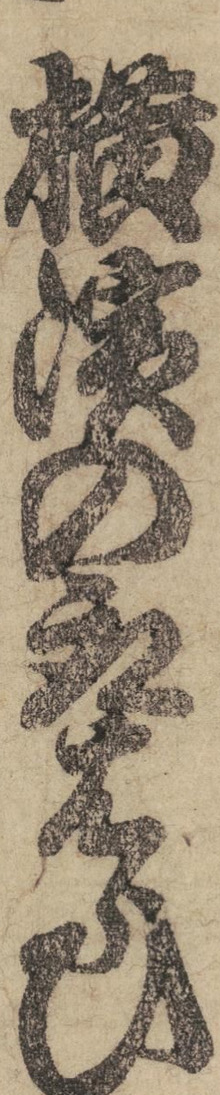横浜の取はらひ
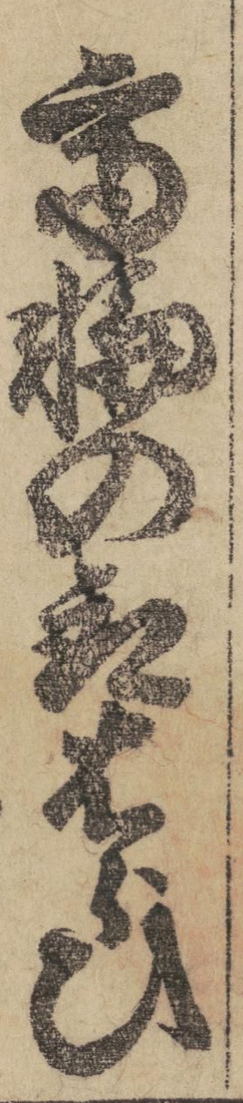高輪の取はらひ
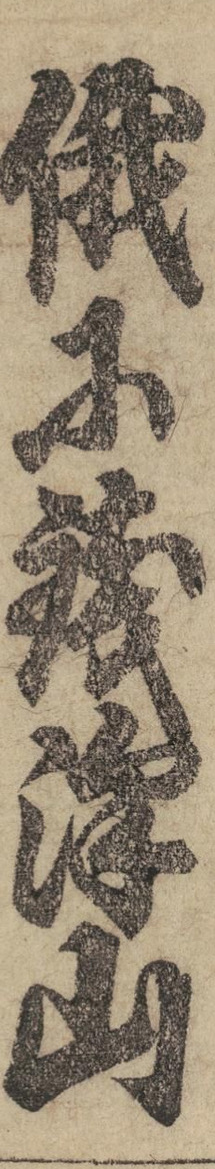俄に銭沢山
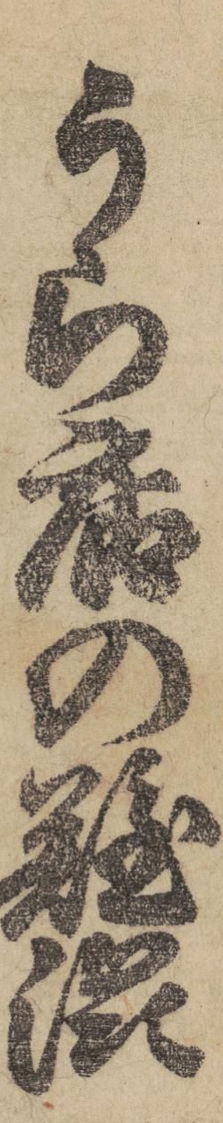うら店の難渋
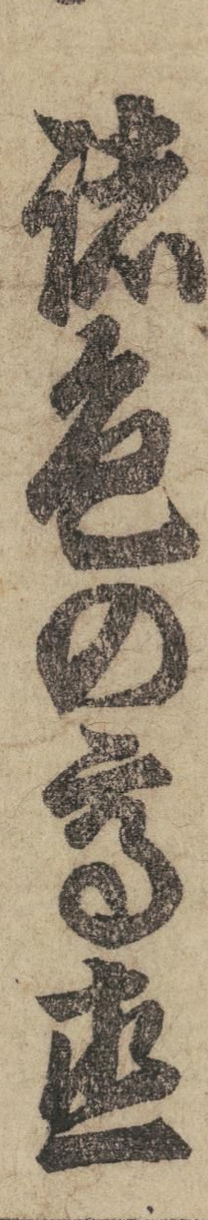諸色の高直
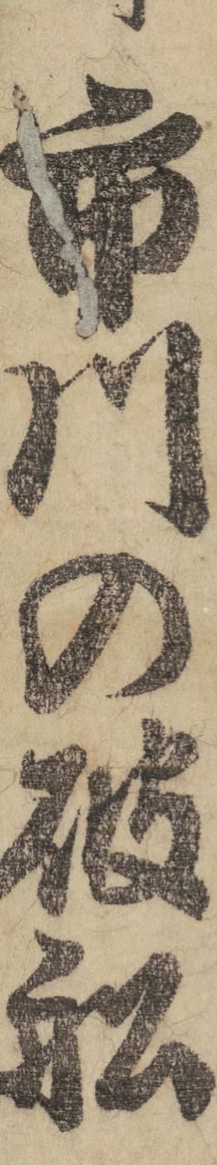市川の破船
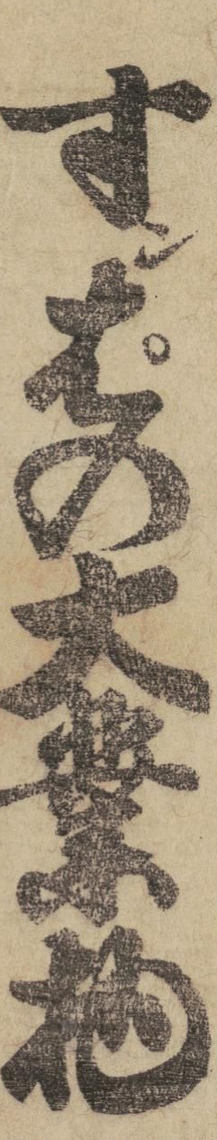寸ンぱの大業物
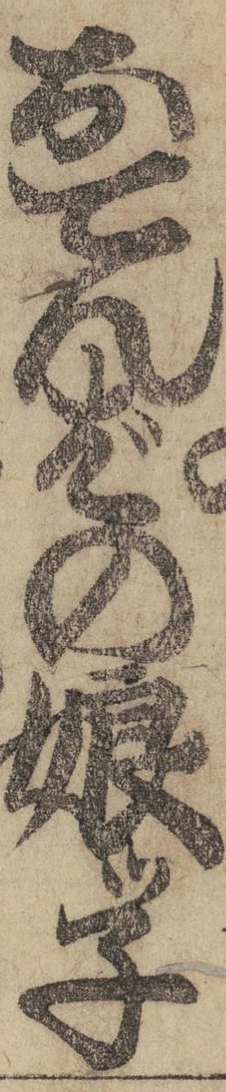おてんばの娘ツ子
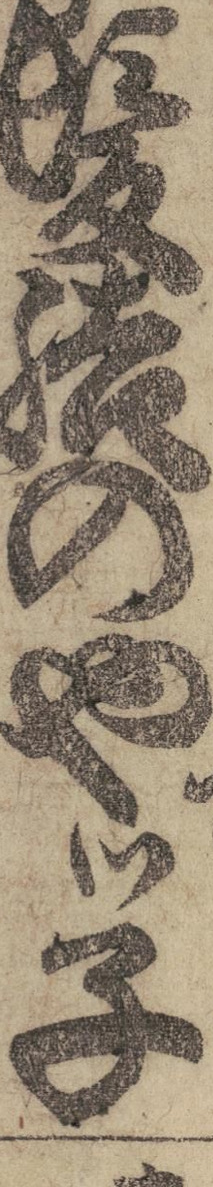髪結のやツ子
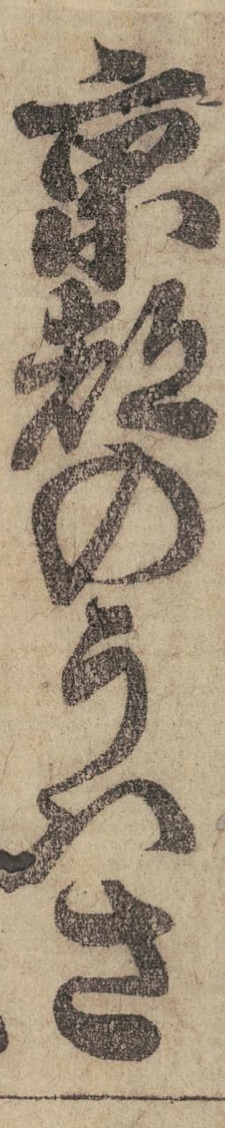京都のうはさ
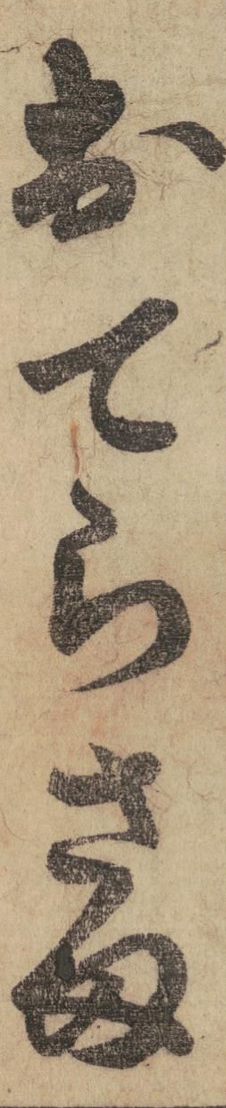おてらさま
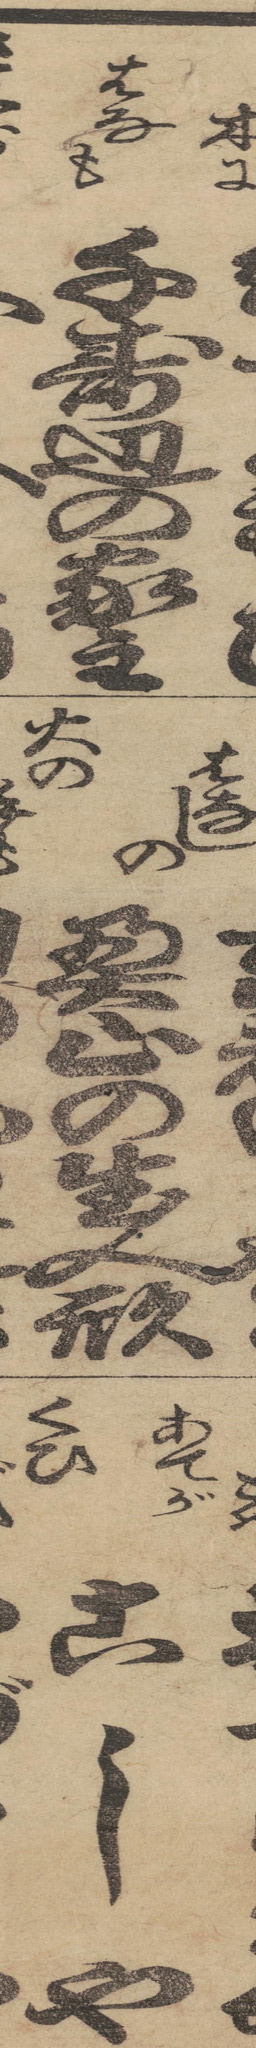千寿辺の家主
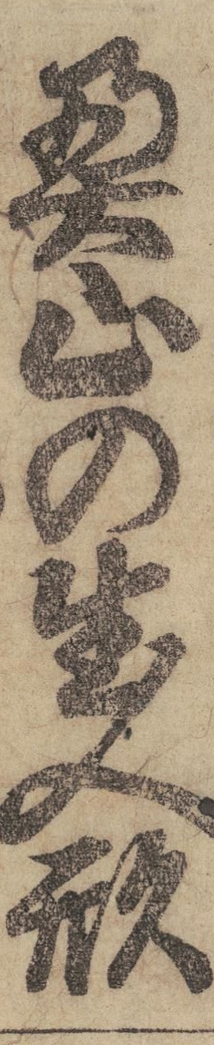奥山の生人形
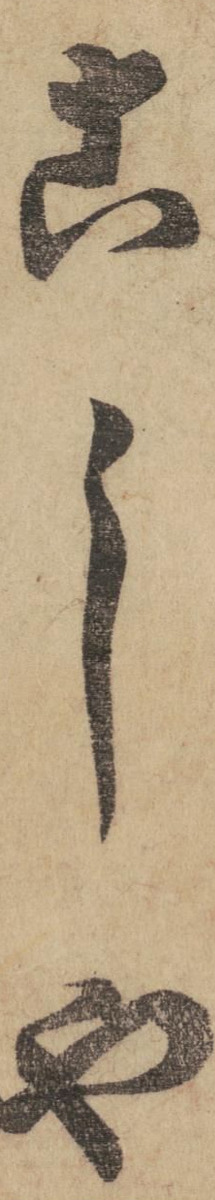こしや
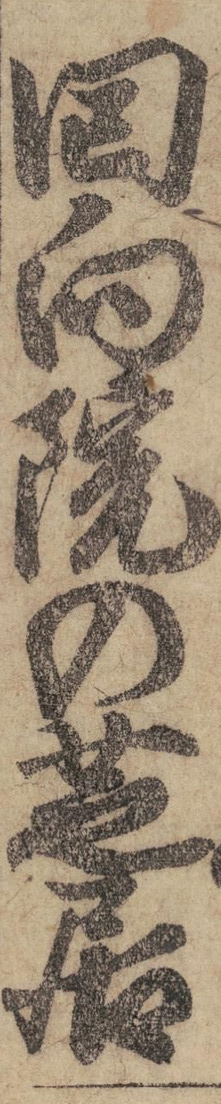回向院の芝居
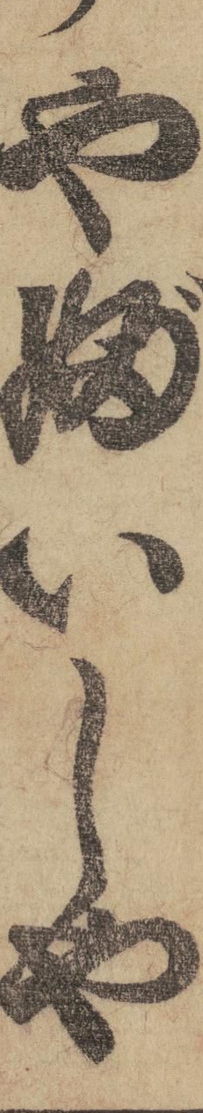やぶいしや
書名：當時見立町盡三幅對初編
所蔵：東京大学地震研究所図書室 Earthquake Research Institute Library, The University of Tokyo, JAPAN
